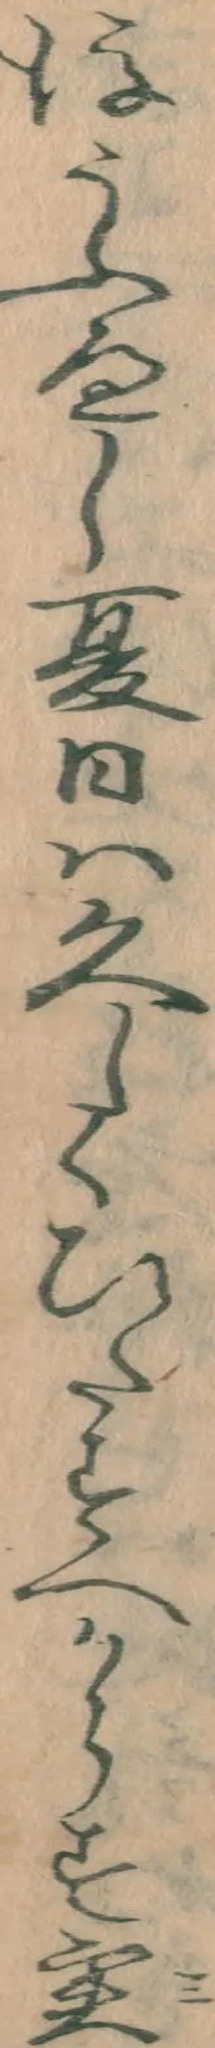後うふへし夏日は久しくひたすへからす実
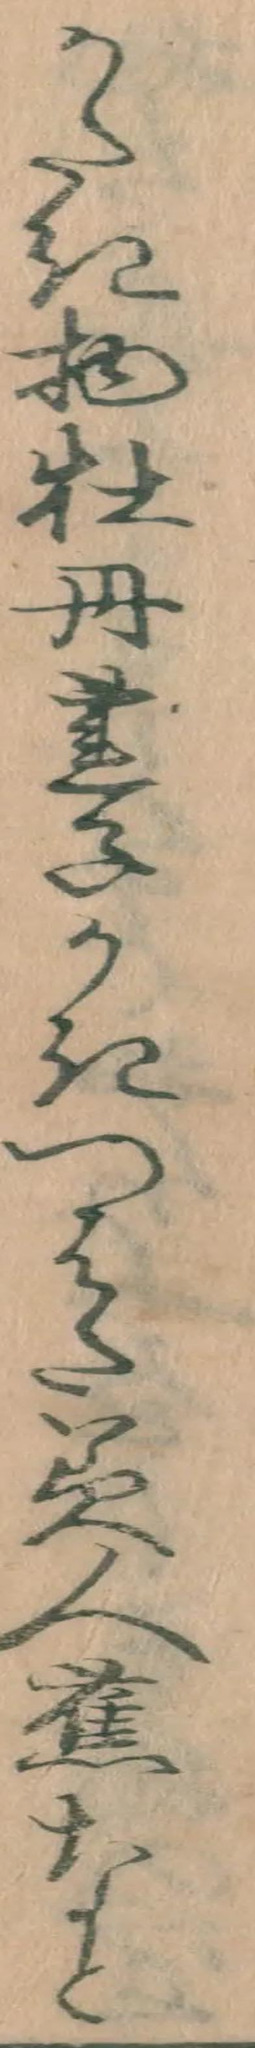かたき物牡丹蓮子かきつはた美人蕉なと
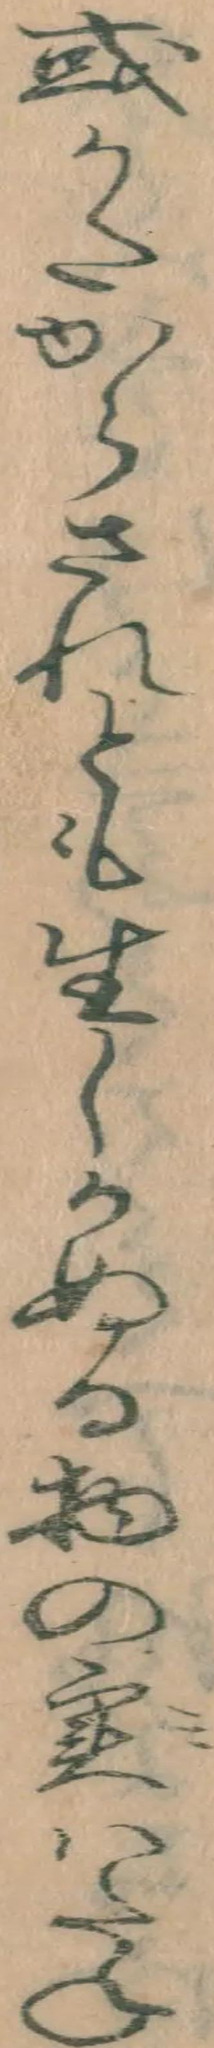或かたからされとも生しかぬる物の実はたね
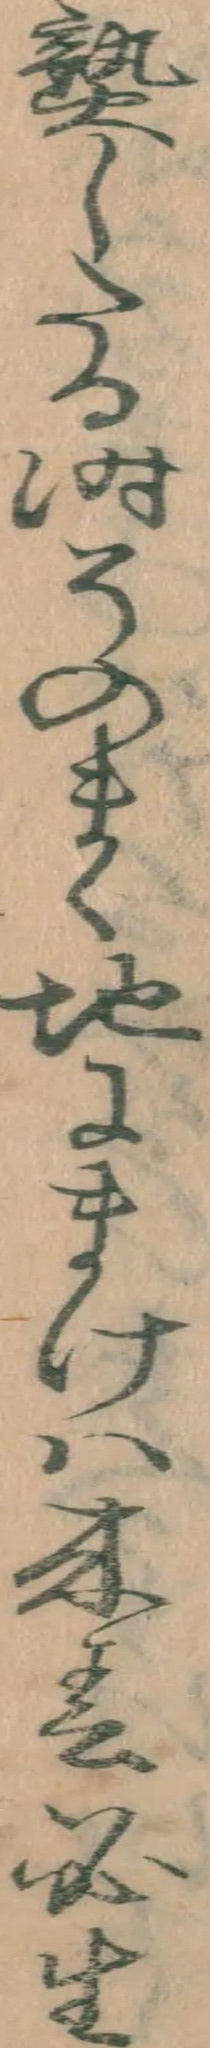熟したる時そのまゝ地にまけは来春必生
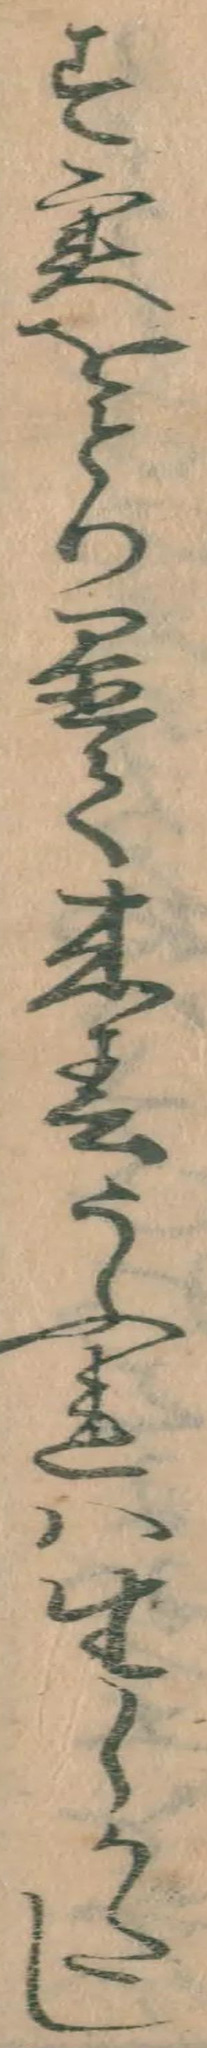す実をとり置て来春うふれは生しかたし
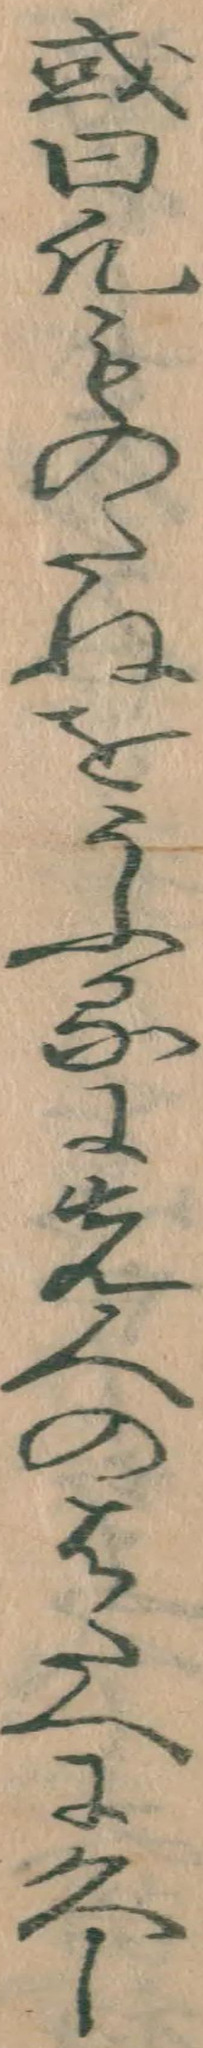或日凡ものたねをうふるに先人のはたへに久し
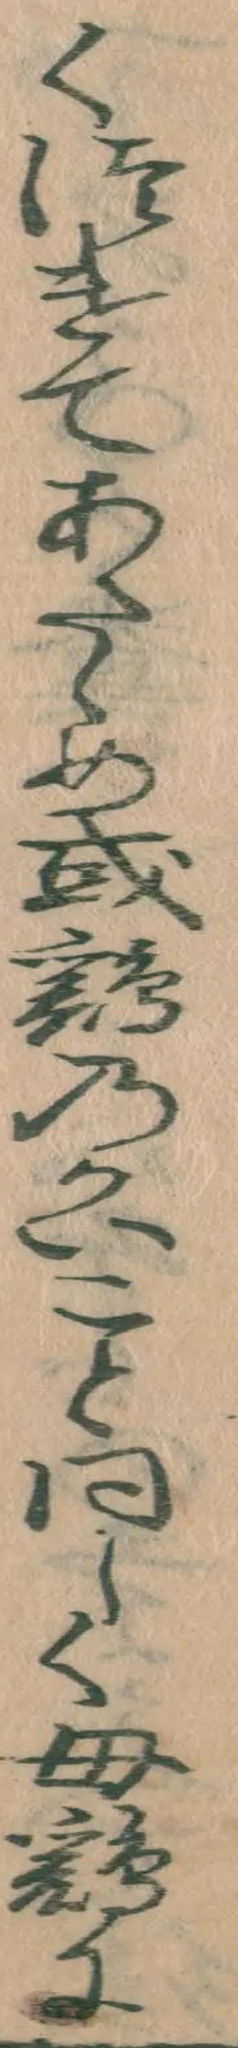くつけてあたゝめ或鶏のかいこと同しく母鶏に
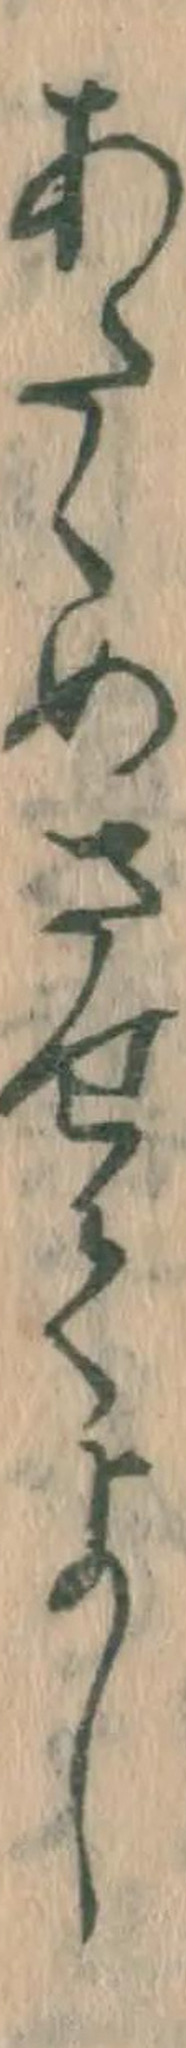あたゝめさせてよし
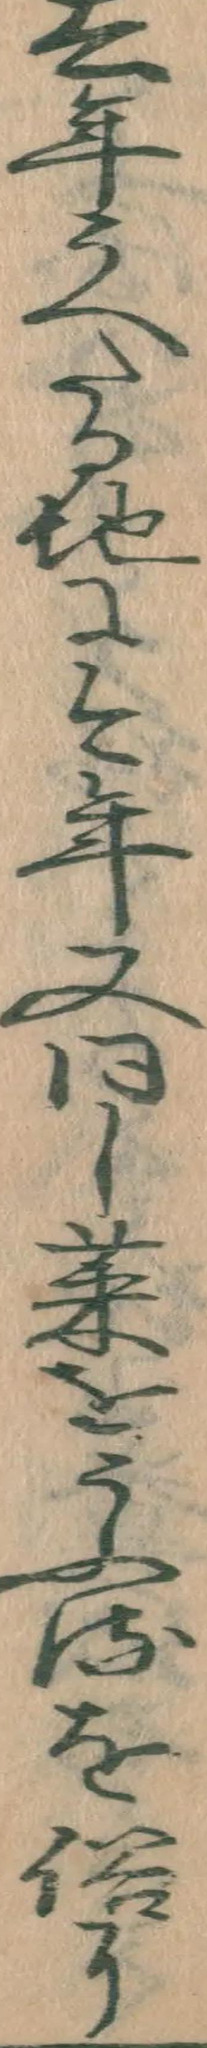去年うへたる地に今年又同し菜をうふるを俗に
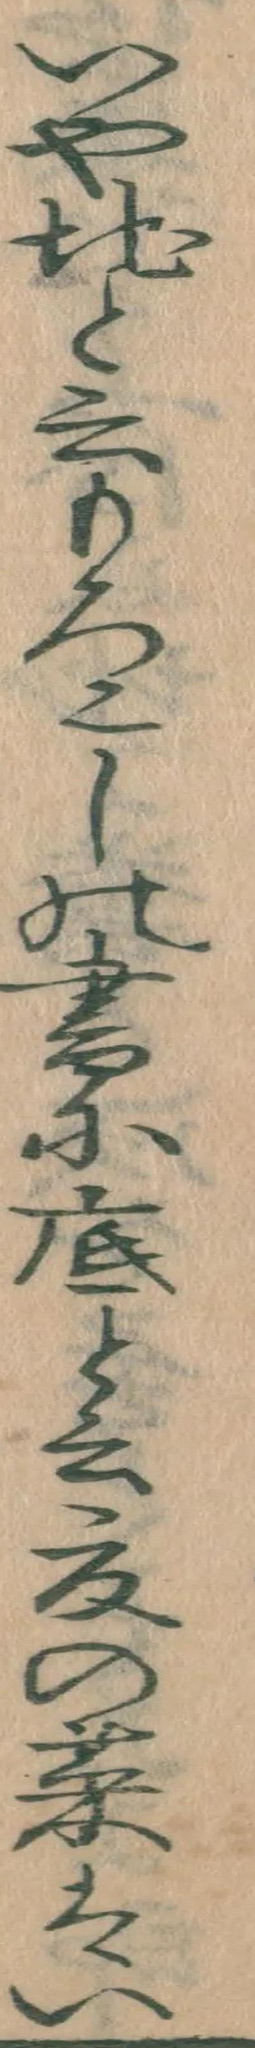いや地と云もろこしの書に底と云夏の菜はい
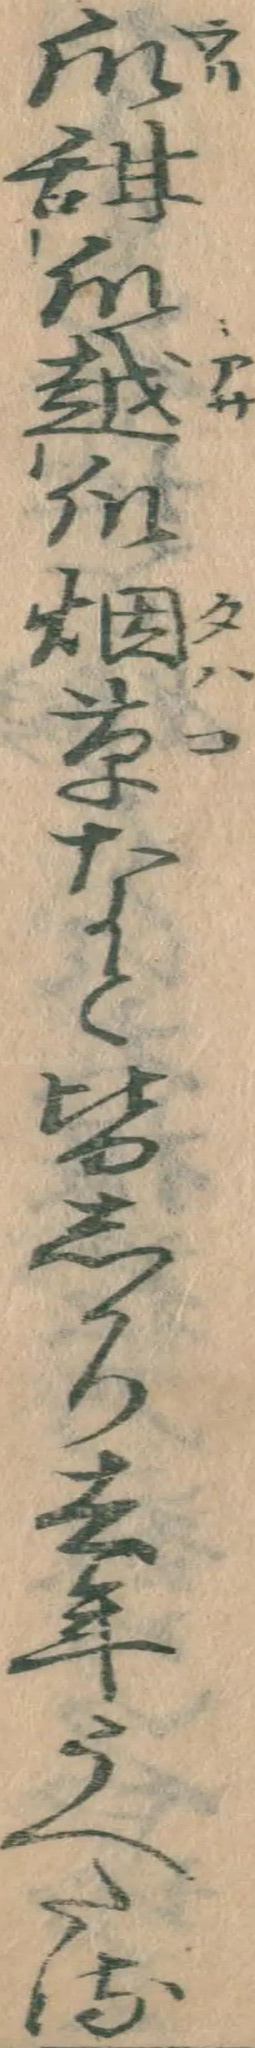瓜甜-瓜越-瓜烟草なと皆しかり去年うへたる
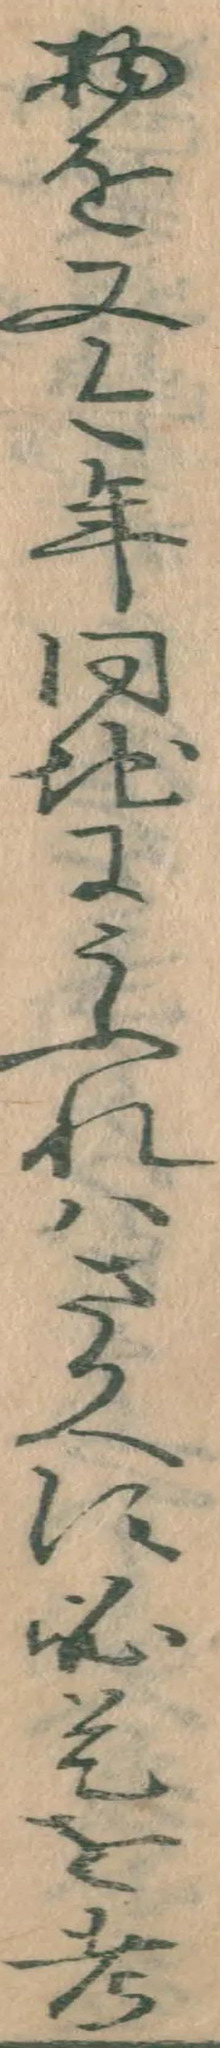物を又今年同地にうふれはさかへす必是を考
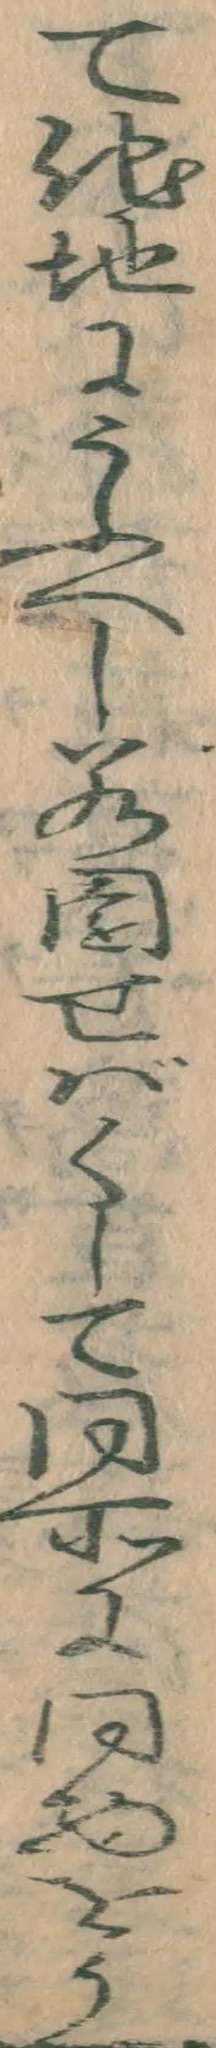て他地にうふへし若園せばくして同所に同物をう
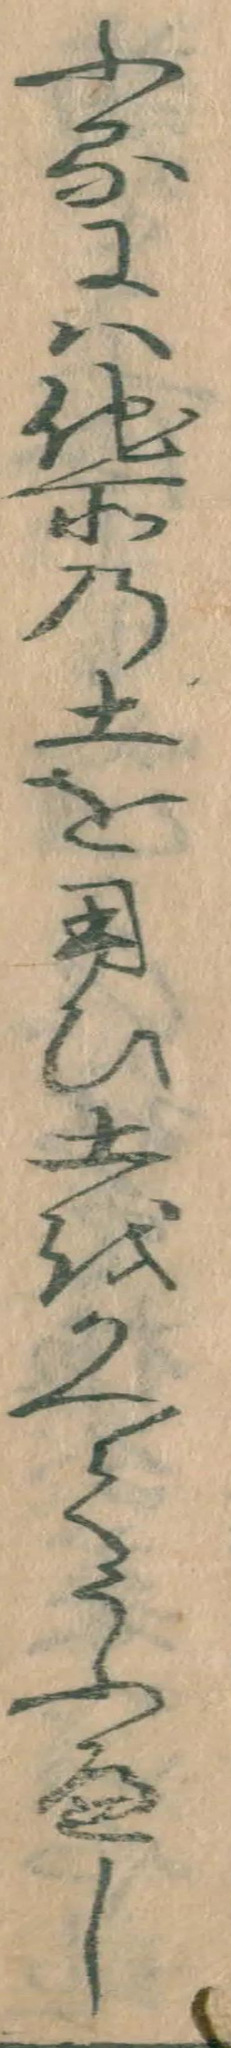ふるには他所の土を用ひ土をかへてうふへし

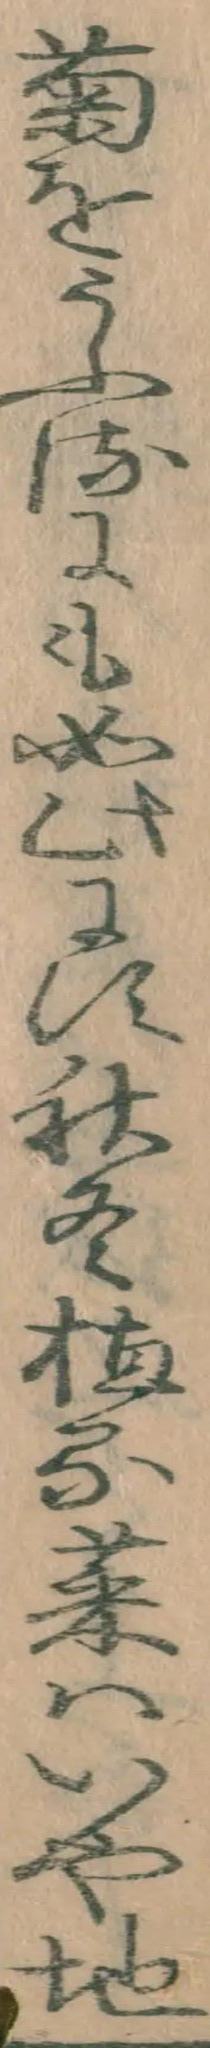菊をうふるにも如此にす秋冬植る菜はいや地
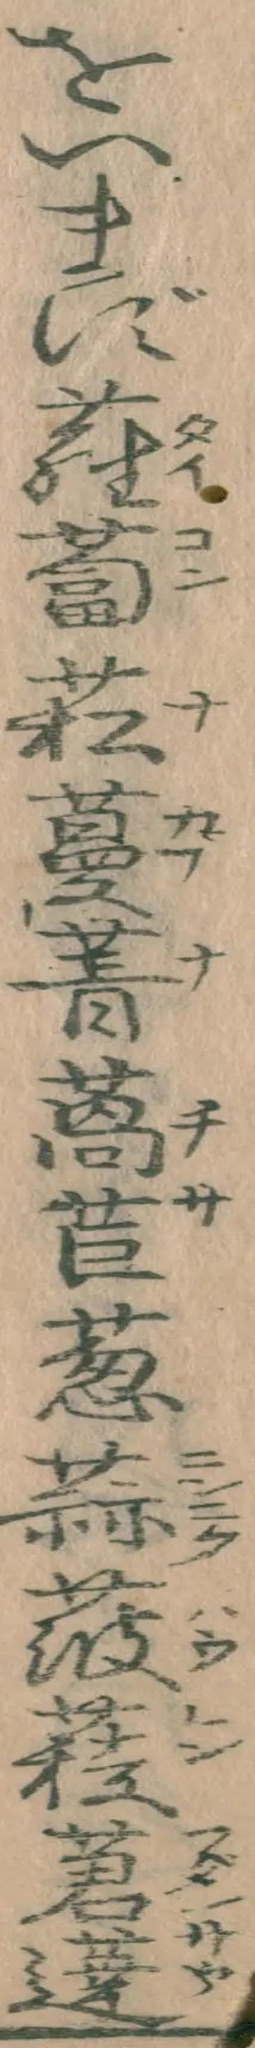をいまず蘿蔔菘蔓-菁萵苣葱蒜菠薐莙薘
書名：菜譜 3巻
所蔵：国立国会図書館 National Diet Library, JAPAN
